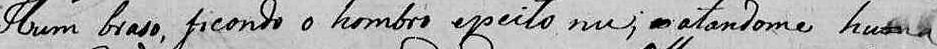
Hum braso, ficando o hombro e peito nus; atandome hu
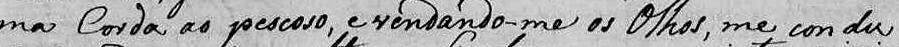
ma corda ao pescoço, e vendando-me os Olhos, me condu
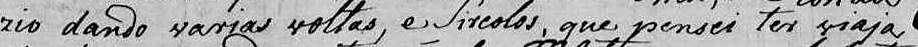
zio dando varias voltas, e sircolos, que pensei ter viaja
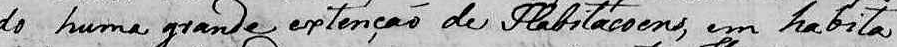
do huma grande extençaõ de Habitaçoens, em habita
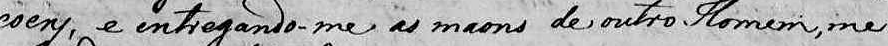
çoens, e entregando-me as maons de outro Homem, me
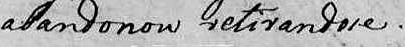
abandonou retirando-se.
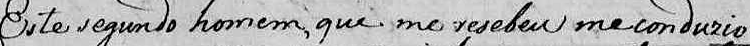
Este segundo homem, que me resebeu me conduzio
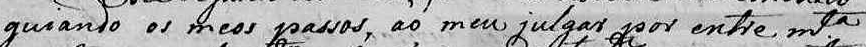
guiando os meos passos, ao meu julgar por entre m.ta
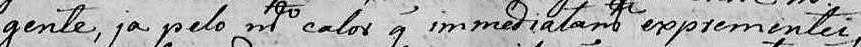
gente, ja pelo m̄to calor q̄ immediatam̄te exprementei;
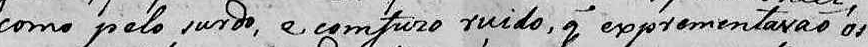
como pelo surdo, e confuzo ruído, q̄̄̄. exprementavaõ os
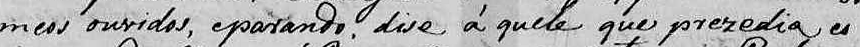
meus ouvidos, eparando, dise àquele que prezedia es
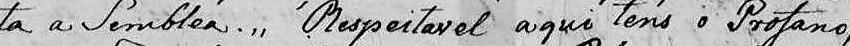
ta aSemblea. "Respeitavel aqui tens o Profano,
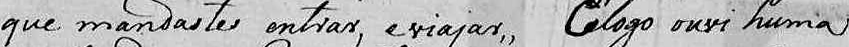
que mandastes entrar, e viajar" E logo ouvi huma
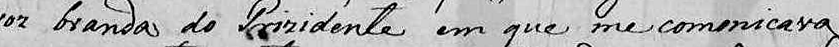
voz branda do Prizidente em que me comonicava
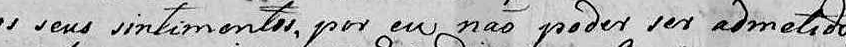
os seus sintimentos, por eu naõ poder ser admetido,
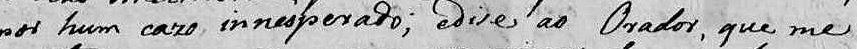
por hum cazo innesperado; e dise ao Orador, que me
